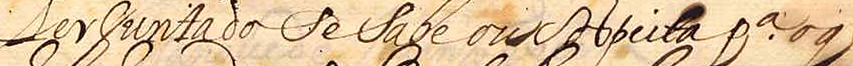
Perguntado se sabe ou sospeita p.a o q̄
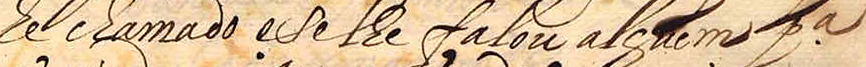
he chamado e se lhe falou alguem p.a
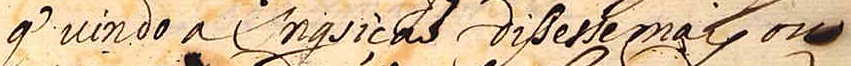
q̄ uindo a Inq̄siçaõ dissesse mais ou
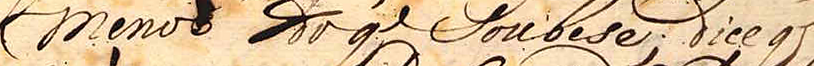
menos do q̄ soubese; dice q̄
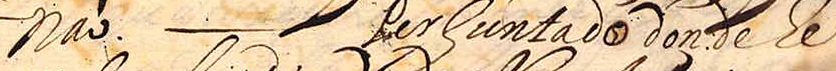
naõ. – Perguntado donde he
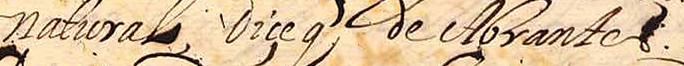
naturaL, Dice q̄ de Abrantes.
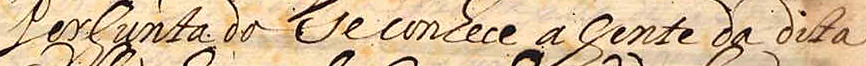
Perguntado se conhece a gente da dita
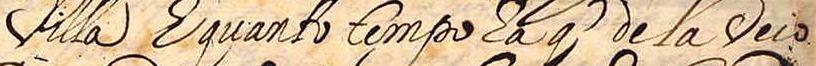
Villa E quanto tempo ha q̄ de la veio
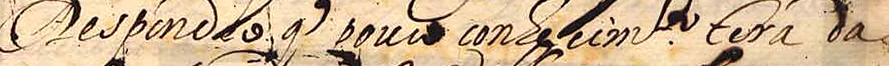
Respondeo q̄ pouco conhecim.to tera da
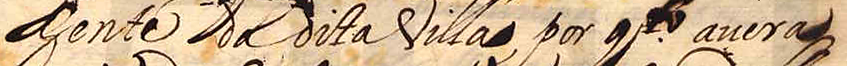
gente da dita Villa, por q.to auera
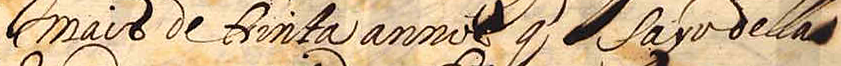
mais de trinta annos q̄ sayo della
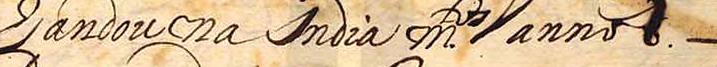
E andou na India m.tos annos.
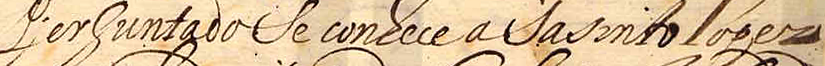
Perguntado se conhece a Iasinto Lopez
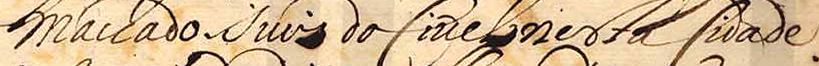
machado Iuiz do Ciuel nesta Cidade
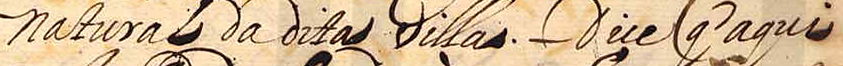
natural da dita villa. – Dice q̄ aqui
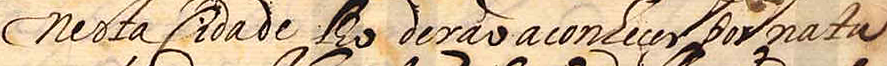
nesta Cidade lho deraõ a conhecer por natu
